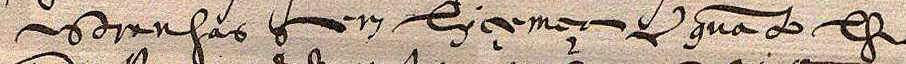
estranhas sem lycemça ēquato lhe
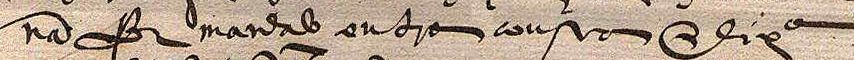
nā for mandado outra cousa ē lixa
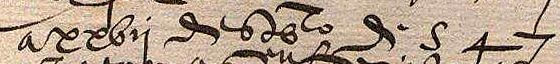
a xxbij de stbro de 547
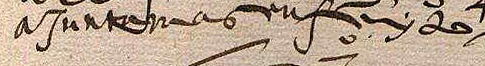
aJuntara a seu feyto /
